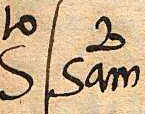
Sto Samto
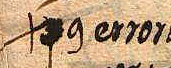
tp̄ꝯ erroris
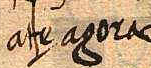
ate agora
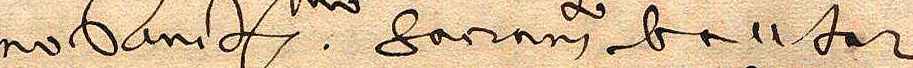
no Sanctjmo sacramto do alltar
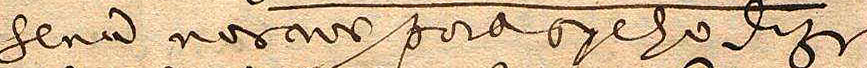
senā nos çeos por asy lho dizer
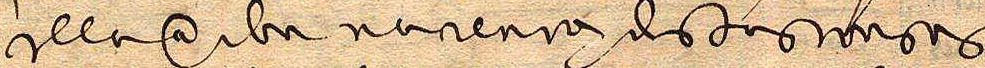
ella ādou na crença destas cousas
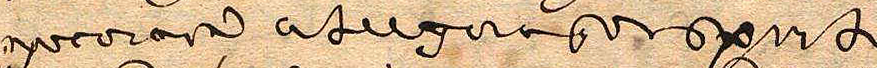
no coraçā atee gora q̄ o esprito
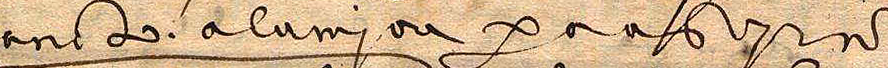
sancto. alumjou ꝑa as vjr cō
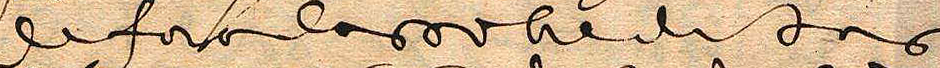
de fora das sobreditas
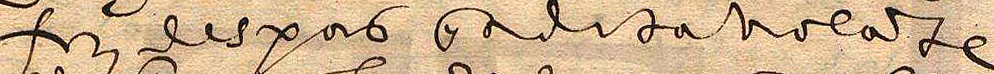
fez despois q̄ a dita violāte
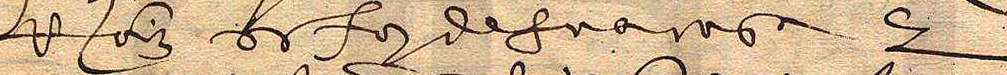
Roīz se foj de sua casa E
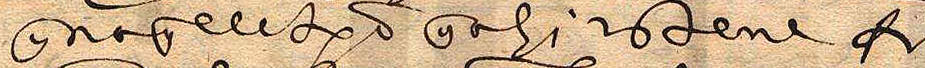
q̄ naq̄lle tpō q̄ ahi esteue fez
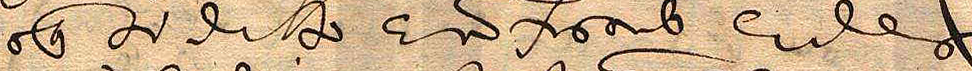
o q̄ tē dito E cōfesado E des
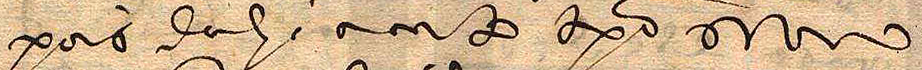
pois dahi a çerto tpō se veo
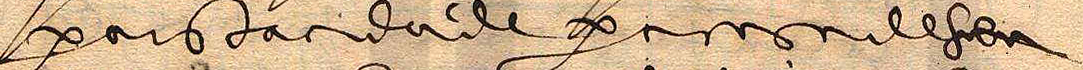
ꝑa esta cidade ꝑa casa de seu
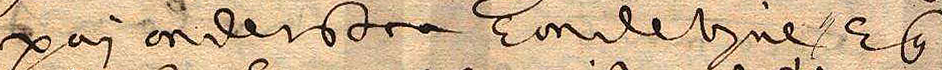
paj onde estaa E onde vjue E q̄
